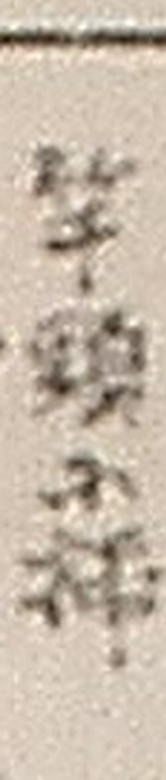竿頭に挿
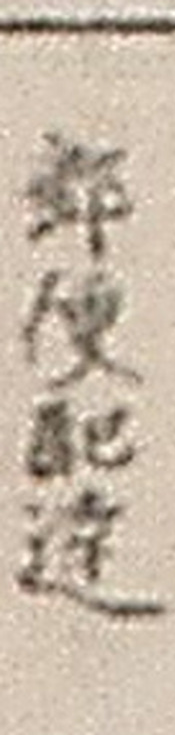郵便配達
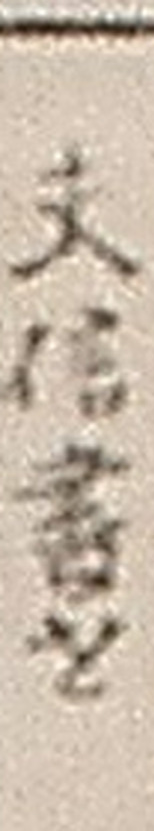夫信書を
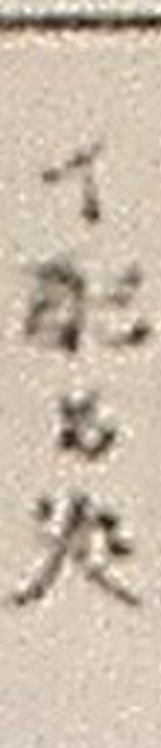て配る処

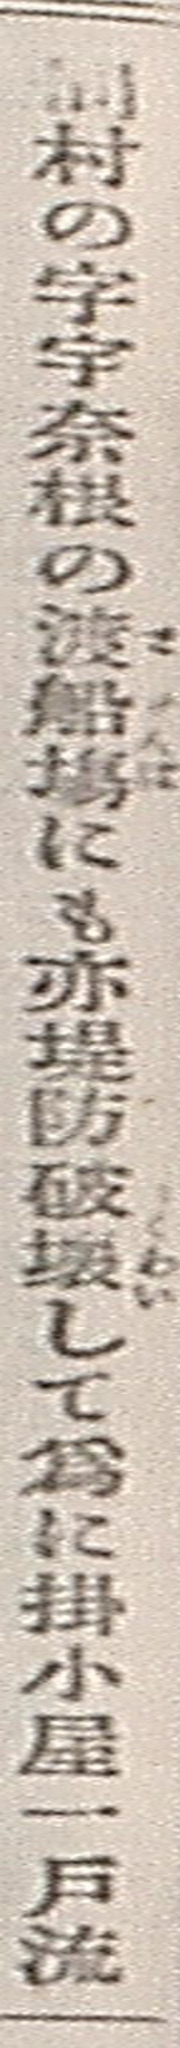村の字宇奈根の渡船場にも亦堤防破壊して為に掛小屋一戸流
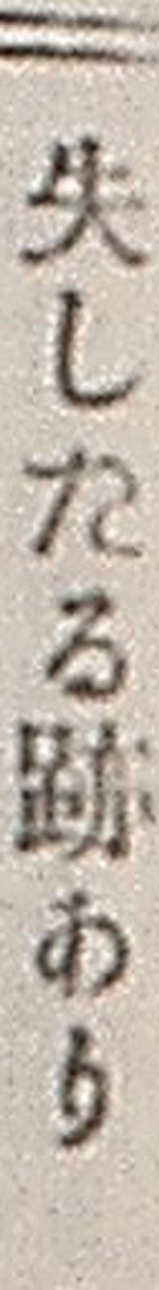失したる跡あり
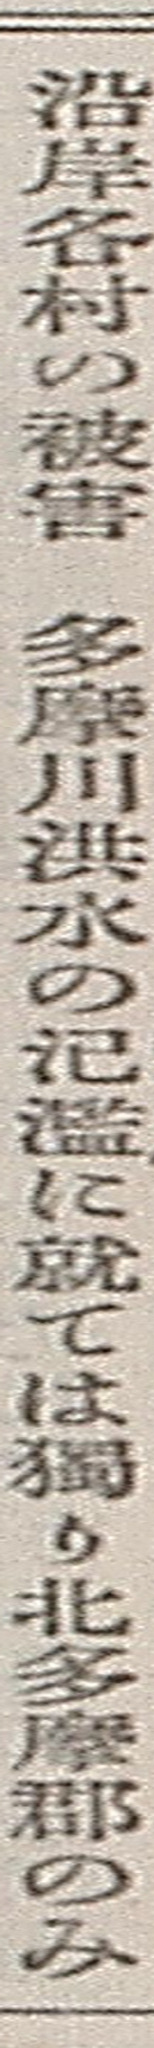沿岸各村の被害多摩川洪水の氾濫に就ては濁り北多摩郡のみ
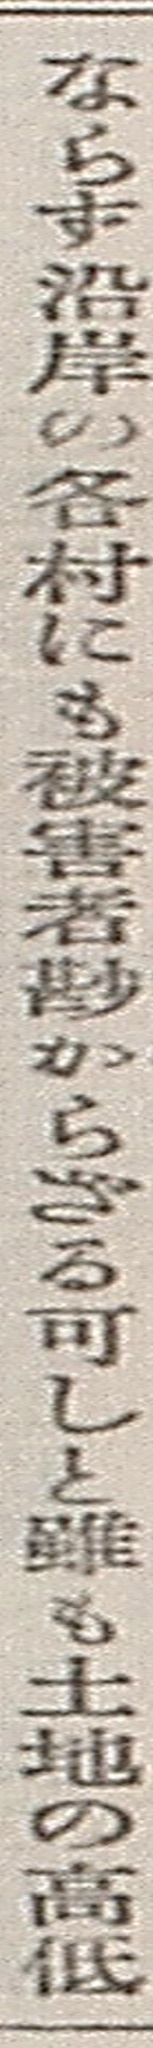ならず沿岸の各村にも被害者尠からざる可しと雖も土地の高低
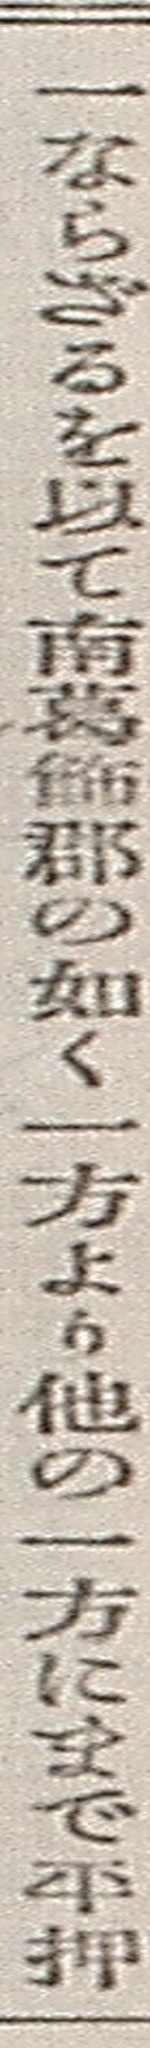一ならざるを以て南葛飾郡の如く一方より他の一方にまで平押
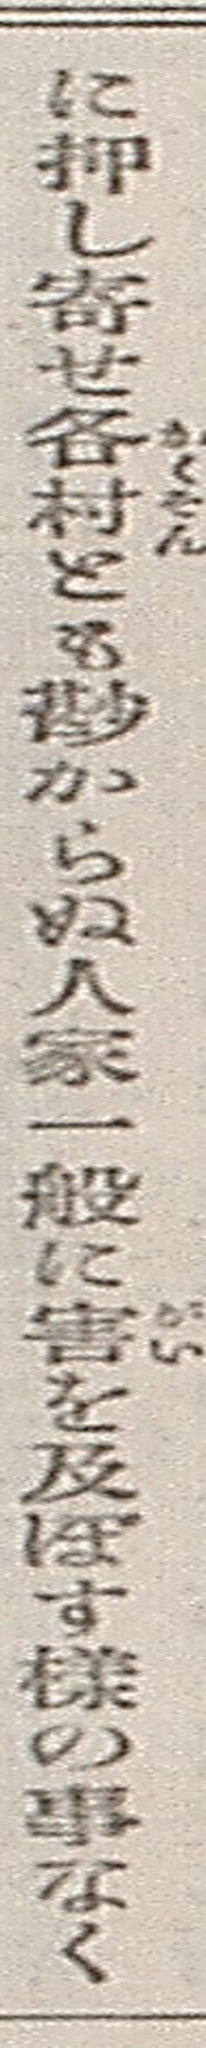に押し寄せ各村とも尠からぬ人家一般に害を及ぼす様の事なく
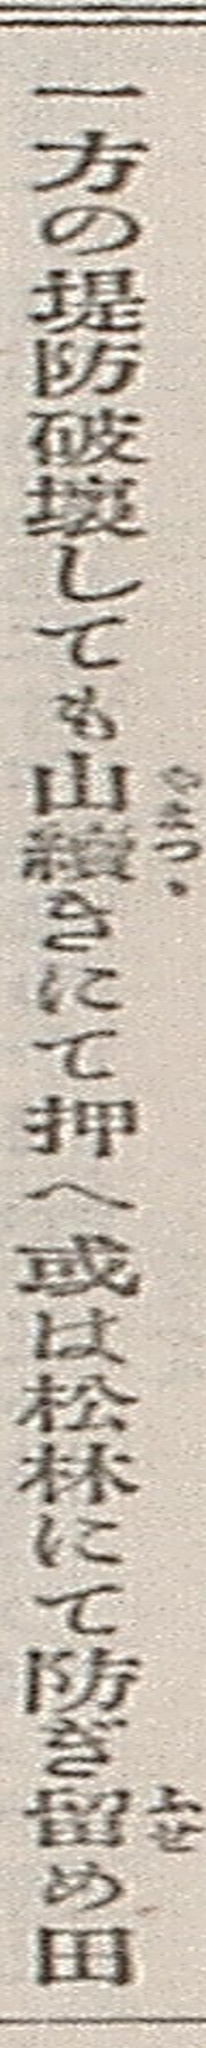一方の堤防破壊しても山続きにて押へ或は松林にて防ぎ留め田
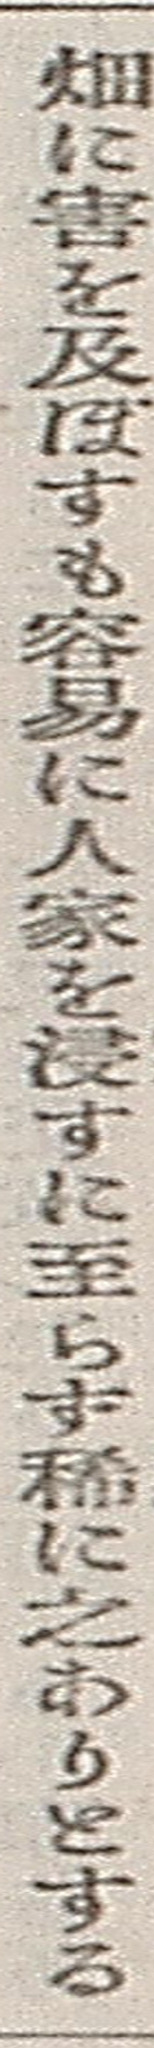畑に害を及ぼすも容易に人家を浸すに至らず稀に之ありとする
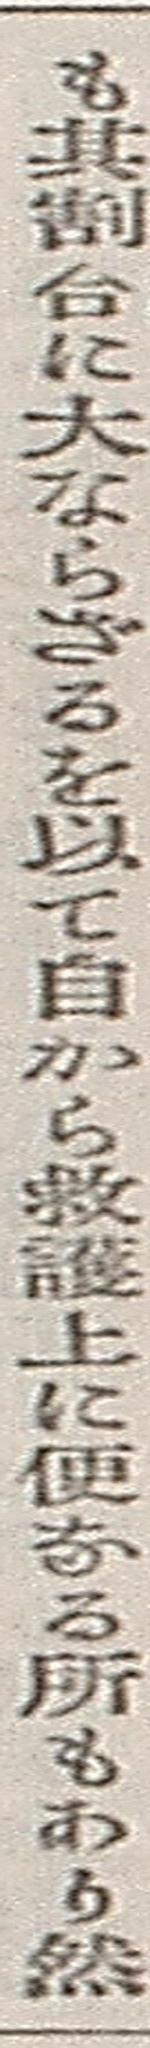も其割合に大ならざるを以て自から救護上に便なる所もあり然
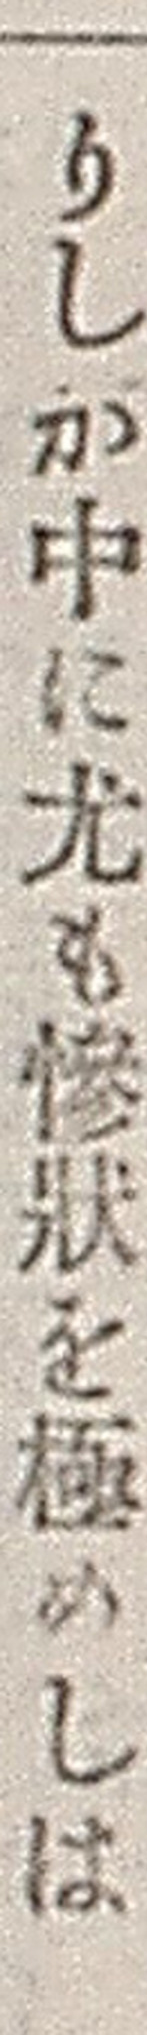りしか中に尤も惨状を極めしは
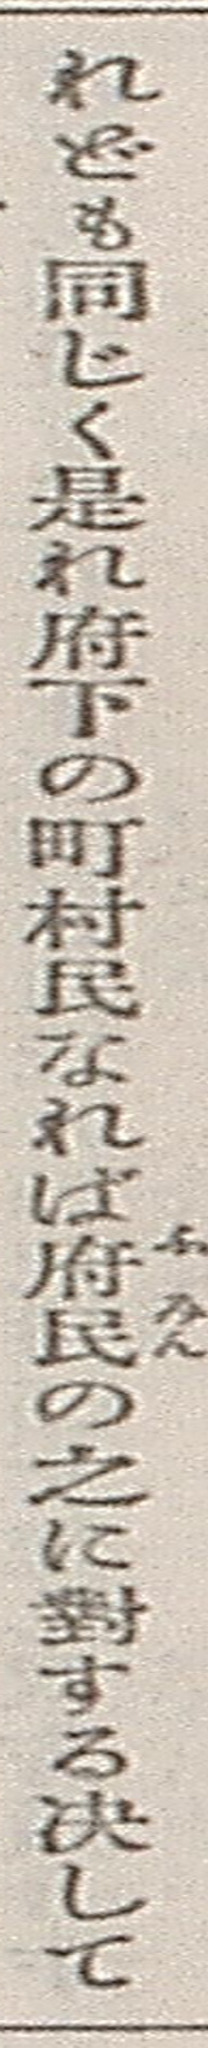れども同じく是れ府下の町村民なれば府民の之に対する決して
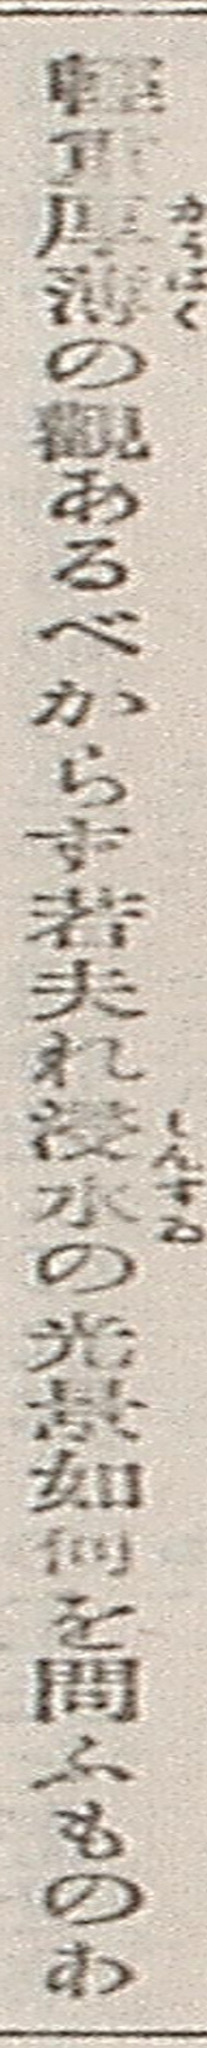軽重厚薄の観あるべからず若夫れ浸水の光景如何を問ふものあ
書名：風俗畫報臨時増刊第百二十四號　洪水地震被害録（上）
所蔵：東京大学地震研究所図書室 Earthquake Research Institute Library, The University of Tokyo, JAPAN
